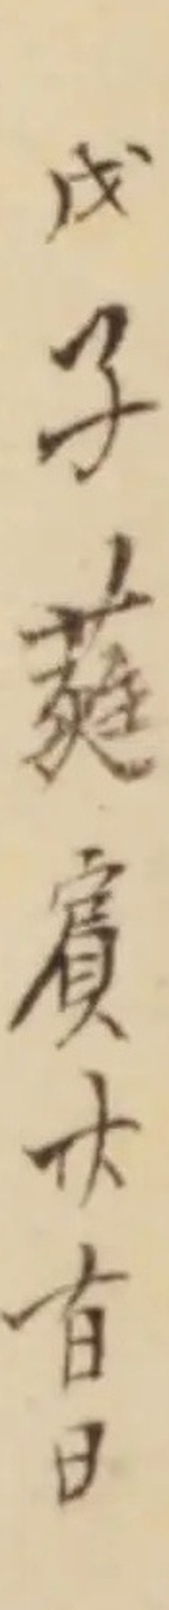戊子蕤賓廿有日
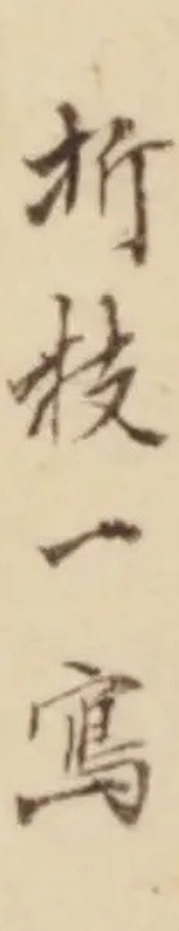折枝一写
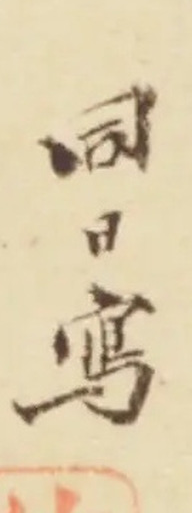同日写

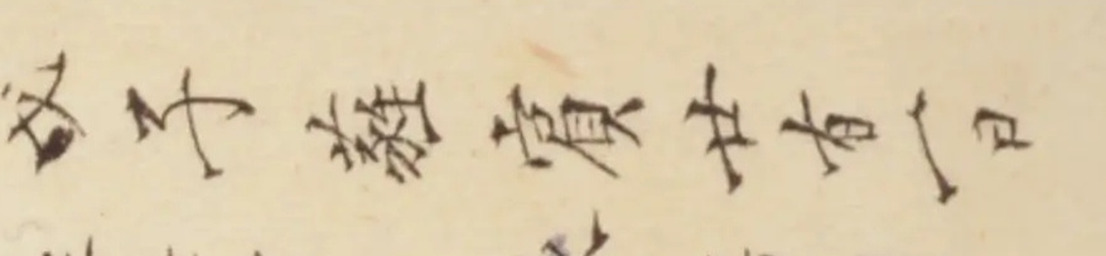戊子蕤賓廿有一日

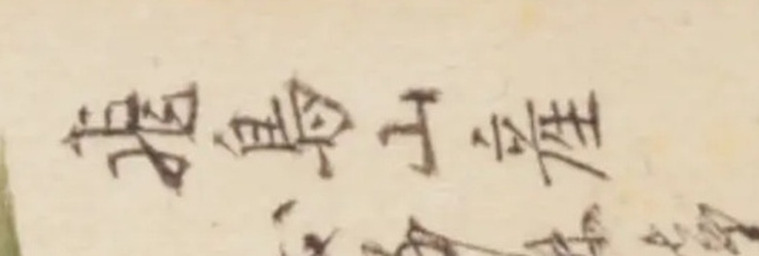飛鳥山産
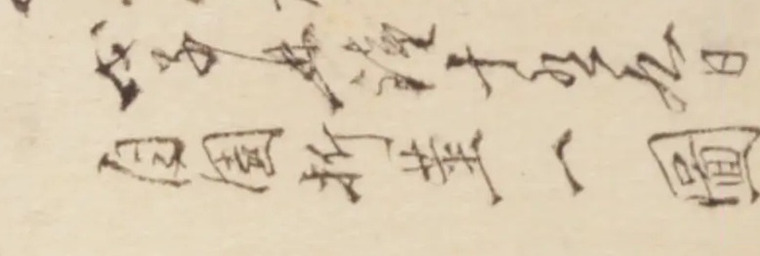自園折茎一図
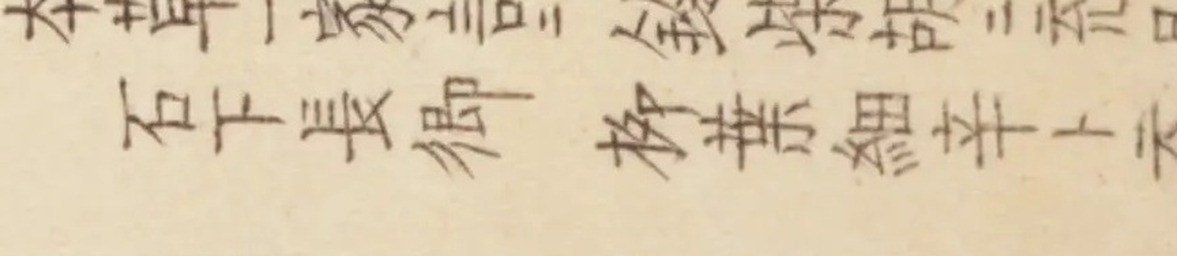石下長柳葉細辛ト云

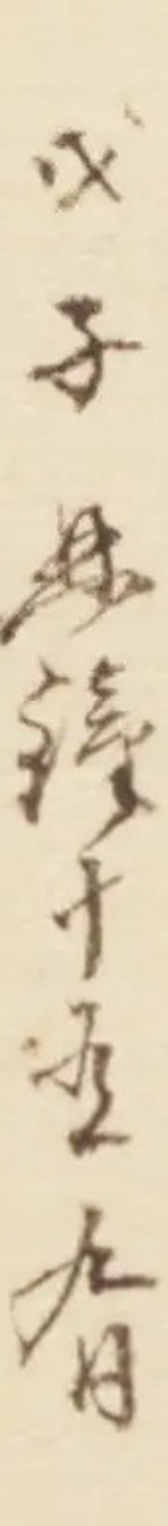戊子林鐘十有九日
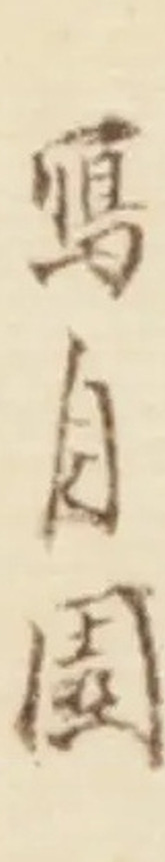写自園

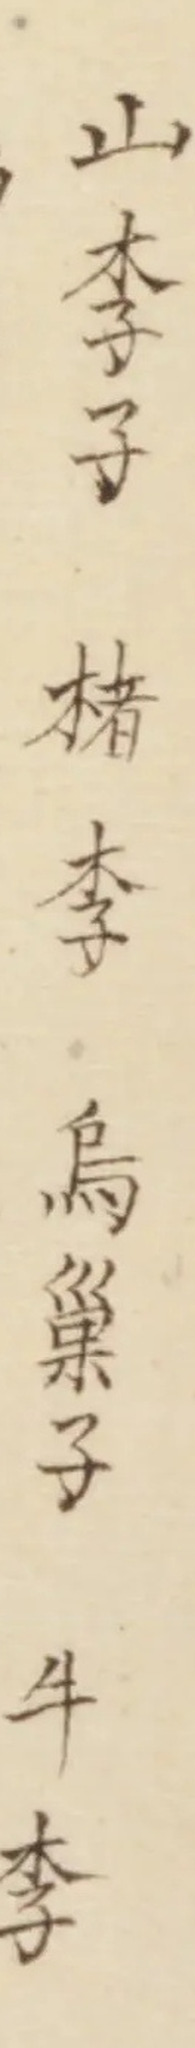山李子楮李烏巣子牛李
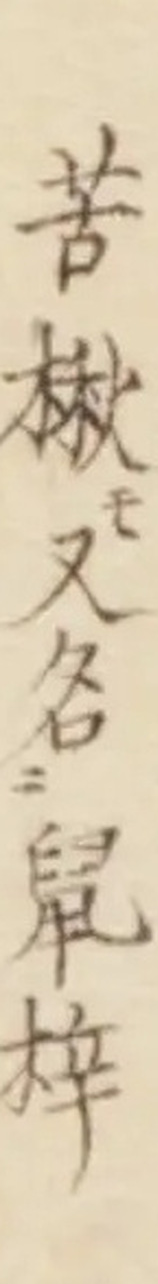苦楸又名鼠梓
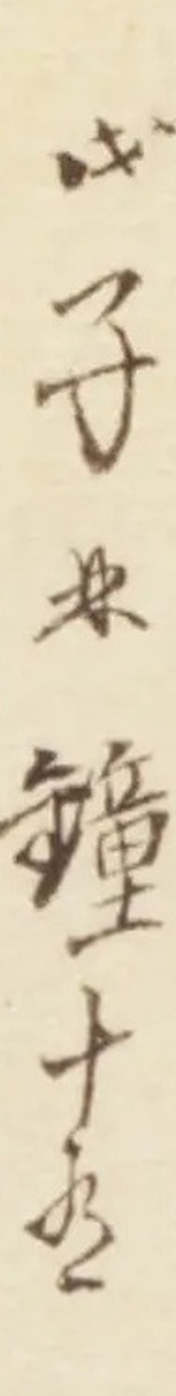戊子林鐘十有
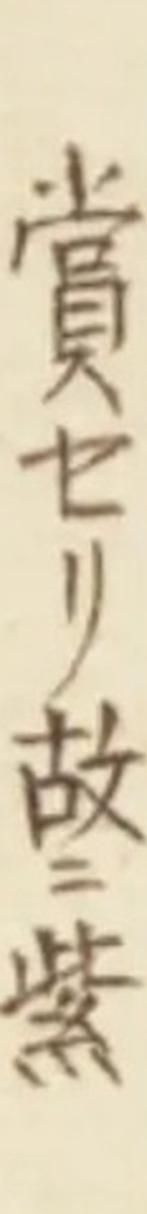賞セリ故ニ紫
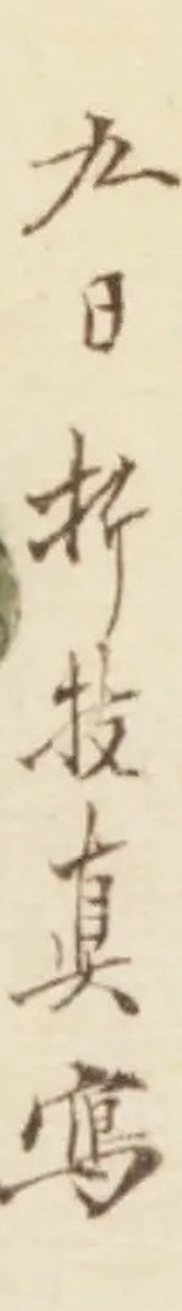九日折枝真写
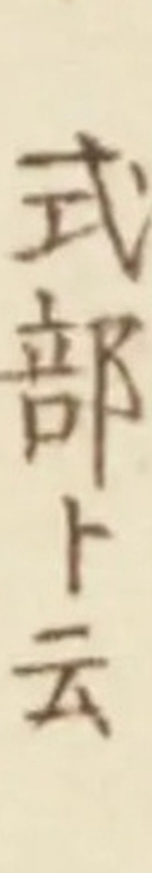式部ト云
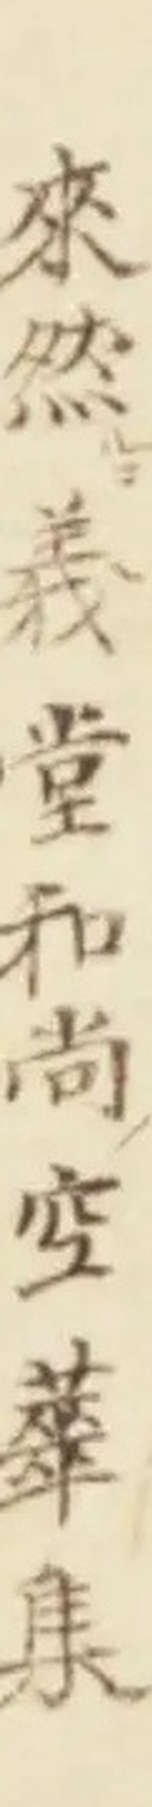来然義堂和尚空華集
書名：梅園草木花譜夏之部. 4
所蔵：国立国会図書館 National Diet Library, JAPAN
